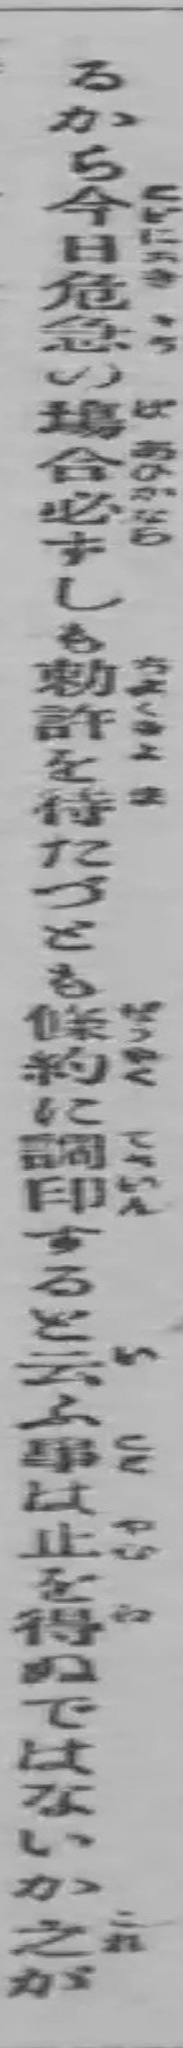るから今日危急の場合必ずしも勅許を待たづとも条約に調印すると云ふ事は止を得ぬではないか之が
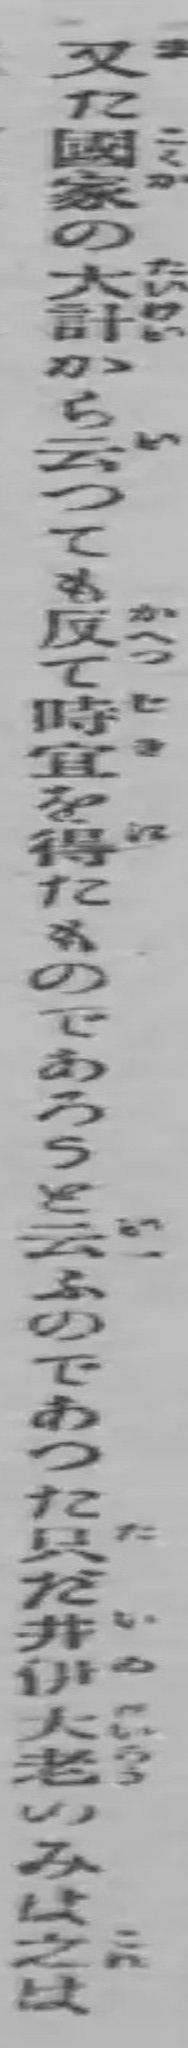又た国家の大計から云つても反て時宜を得たものであろうと云ふのであつた只だ井伊大老のみは之は
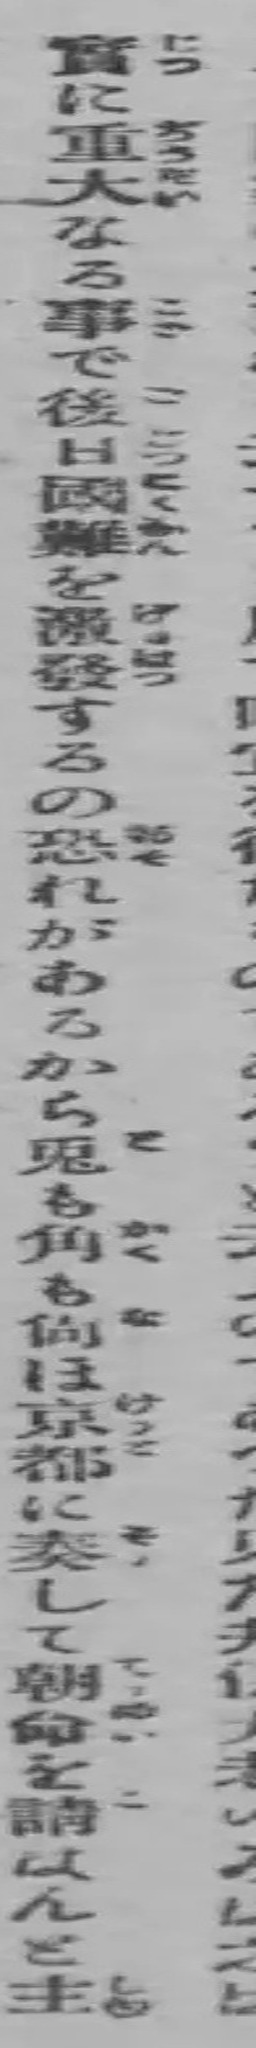実に重大なる事で後日国難を激発するの恐れがあるから兎も角も尚ほ京都に奏して朝命を請はんと主
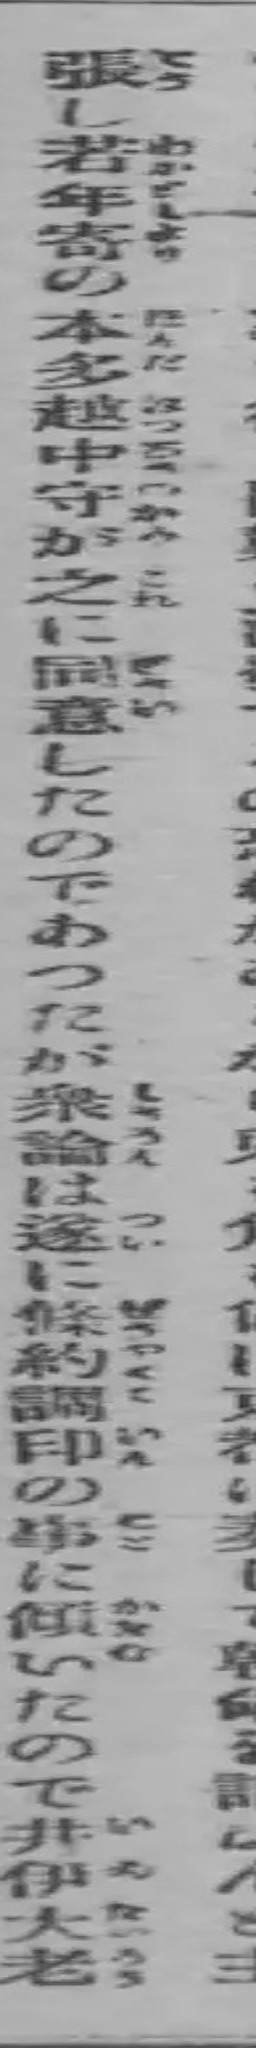張し若年寄の本多越中守が之に同意したのであつたが衆論は遂に条約調印の事に傾いたので井伊大老

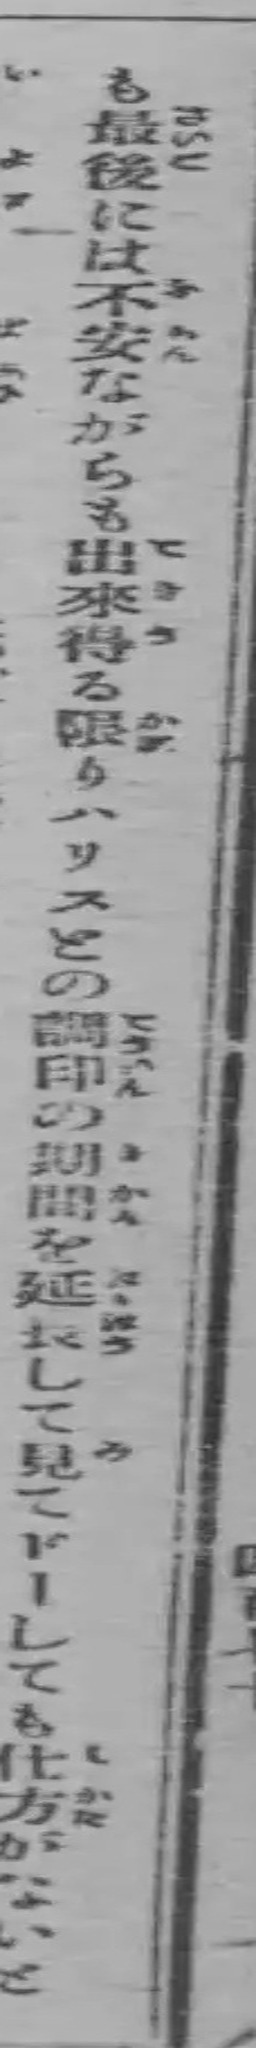も最後には不安ながらも出来得る限りハリスとの調印の期間を延長して見てドーしても仕方がないと
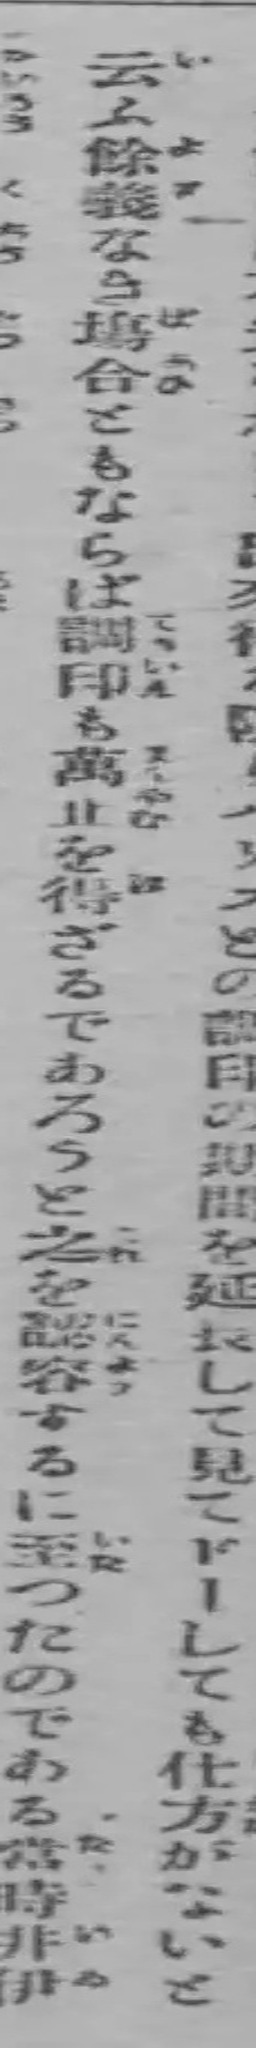云ふ余義なき場合ともならば調印も萬止を得ざるであろうと之を認容するに至つたのである当時井伊
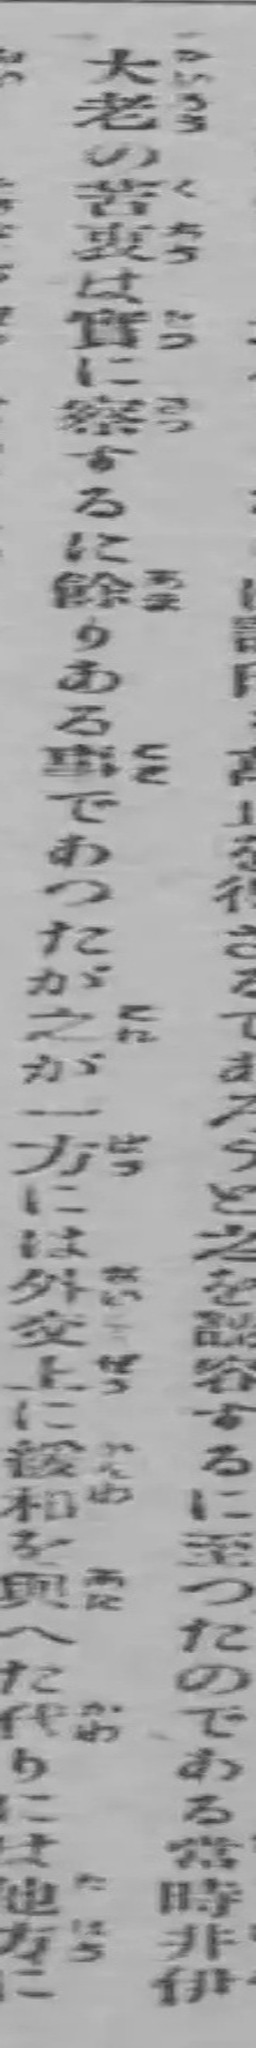大老の苦衷は実に察するに余りある事であつたが之が一方には外交上に緩和を与へた代りには他方に
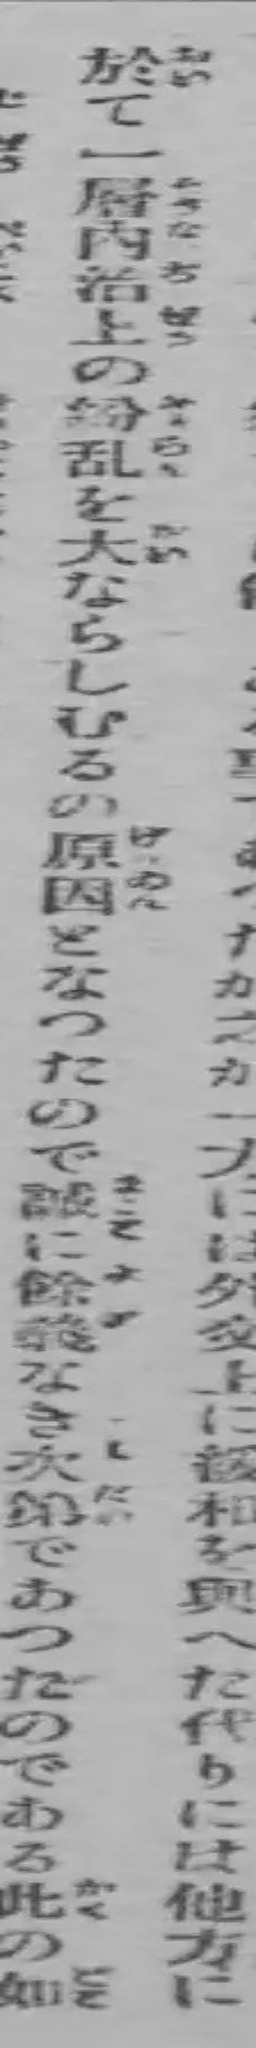於て一層内治上の紛乱を大ならしむるの原因となつたので誠に余義なき次第であつたのである此の如
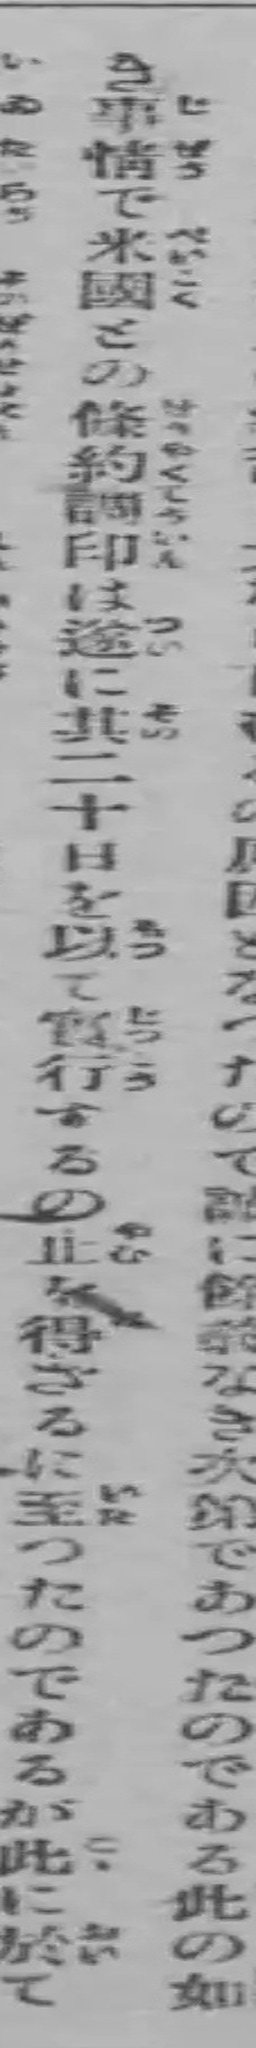き事情で米国との条約調印は遂に其二十日を以て実行するの止を得ざるに至つたのであるが此に於て
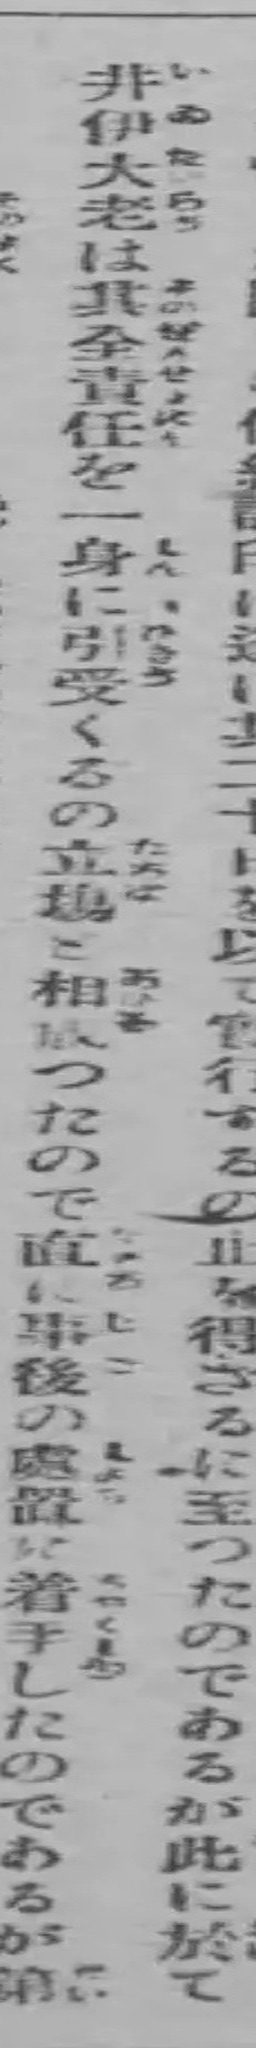井伊大老は其全責任を一身に引受くるの立場と相成つたので直に事後の処置に着手したのであるが第
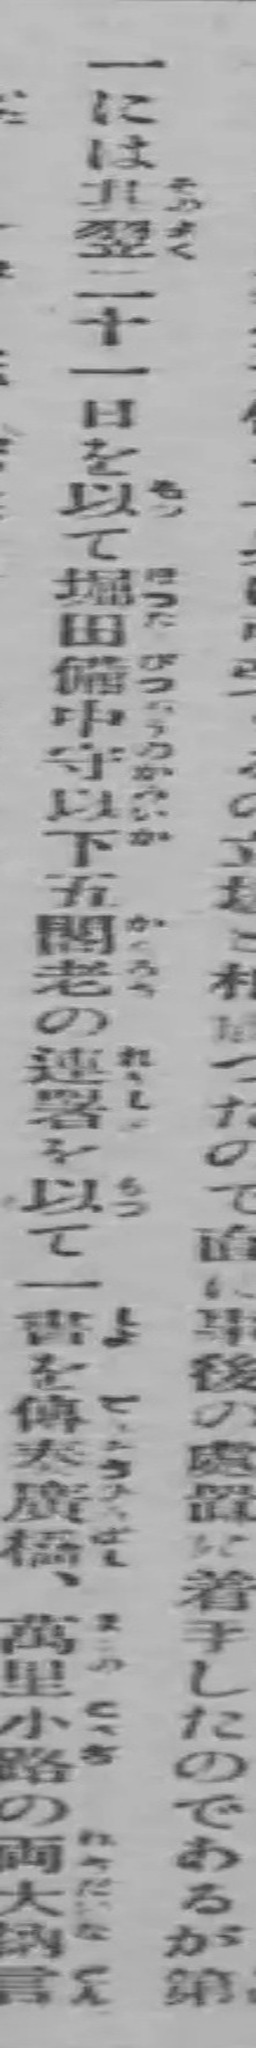一には其翌二十一日を以て堀田備中守以下五閣老の連署を以て一書を伝奏廣橋、万里小路の両大納言
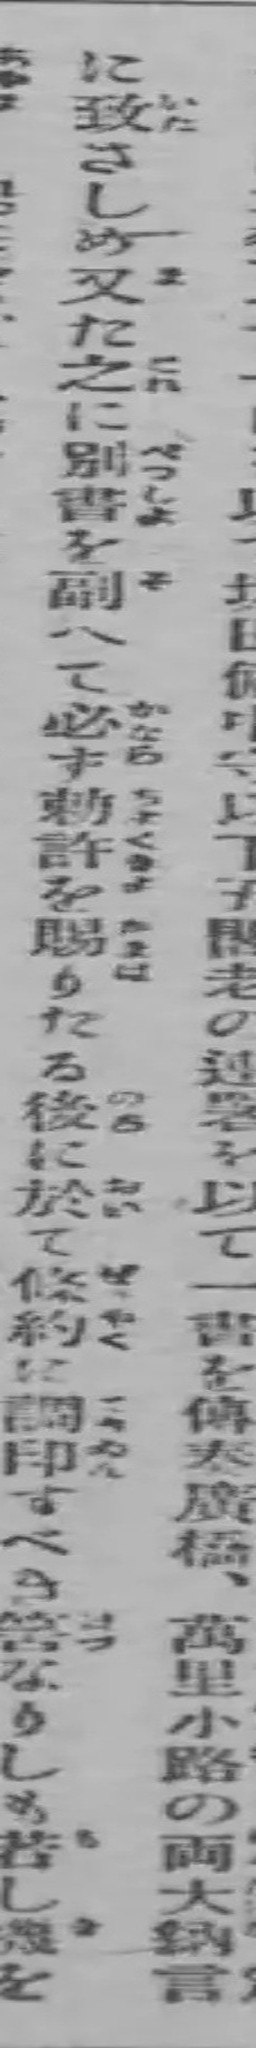に致さしめ又た之に別書を副へて必ず勅許を賜るたる後に於ては条約に調印すべき筈なりしも若し機を
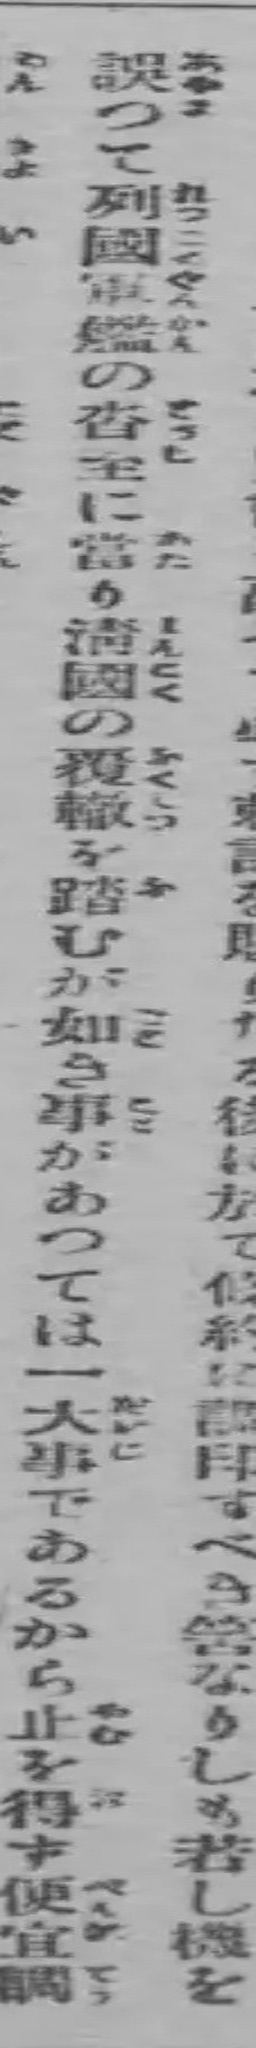誤つて列国軍艦の沓至に当り清国の覆轍を踏むが如き事があつては一大事であるから止を得ず便宜調
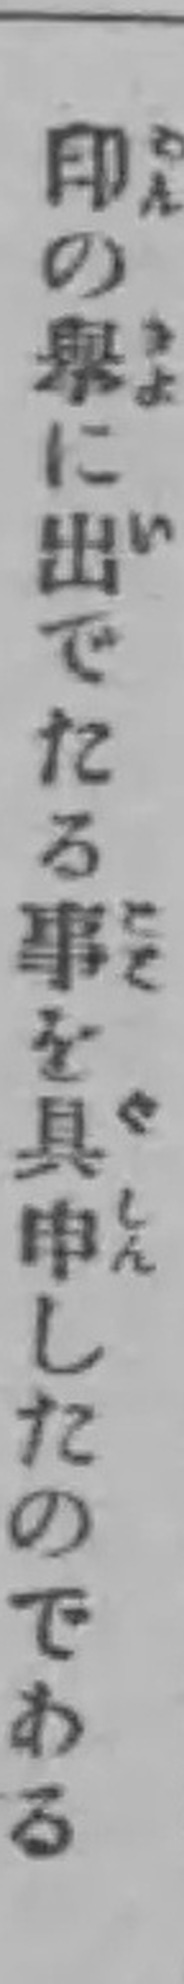印の挙に出でたる事を具申したのである
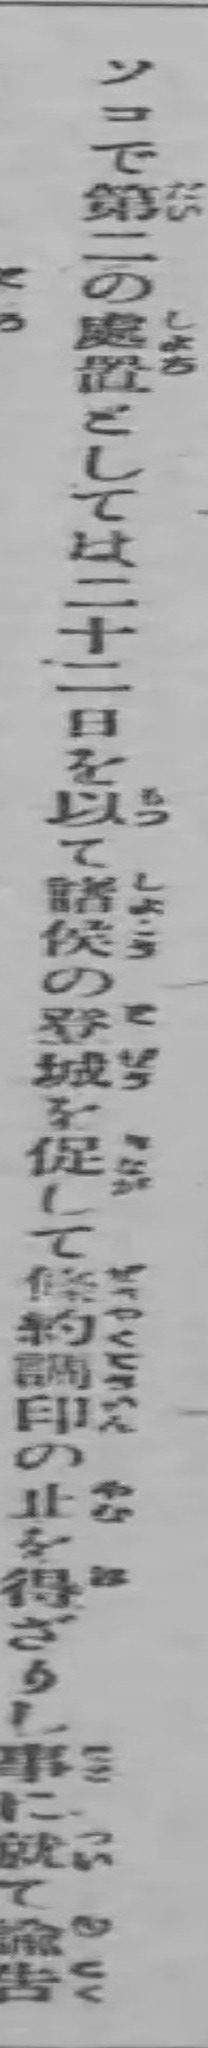ソコで第二の処置としては二十二日を以て諸侯の登城を促して条約調印の止を得ざりし事に就て諭告
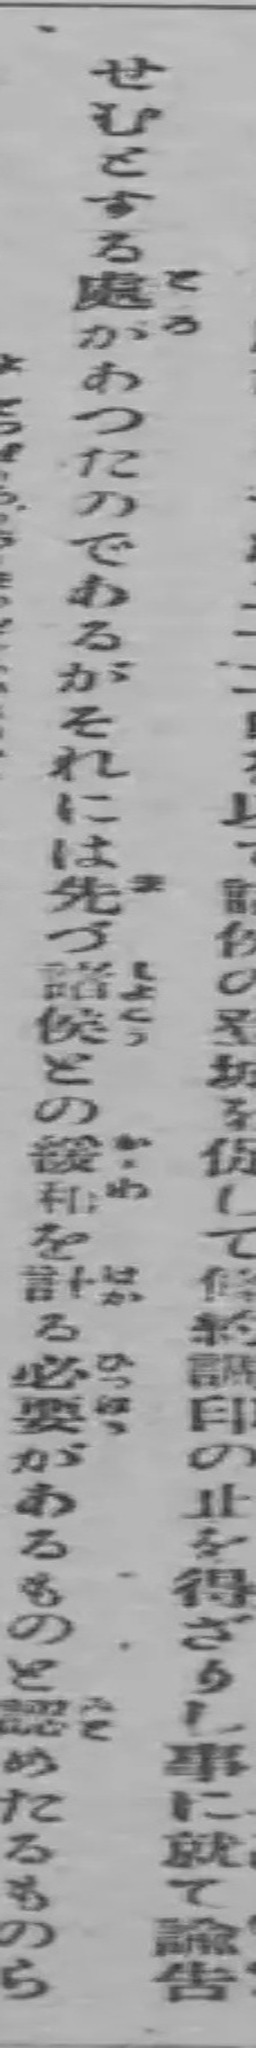せむとする処があつたのであるがそれには先づ諸侯との緩和を計る必要があるものと認めたるものら
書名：豊橋市史談
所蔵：国立国会図書館 National Diet Library, JAPAN
